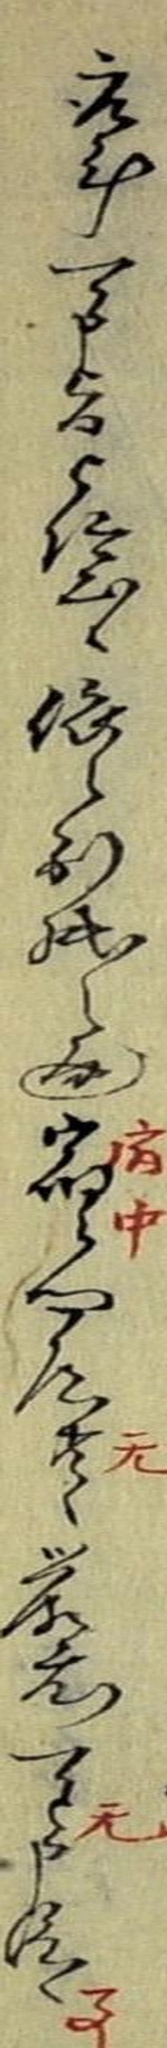取斗可申旨被仰出候依之別紙之通宿之問屋共へ厳敷可被申渡候事
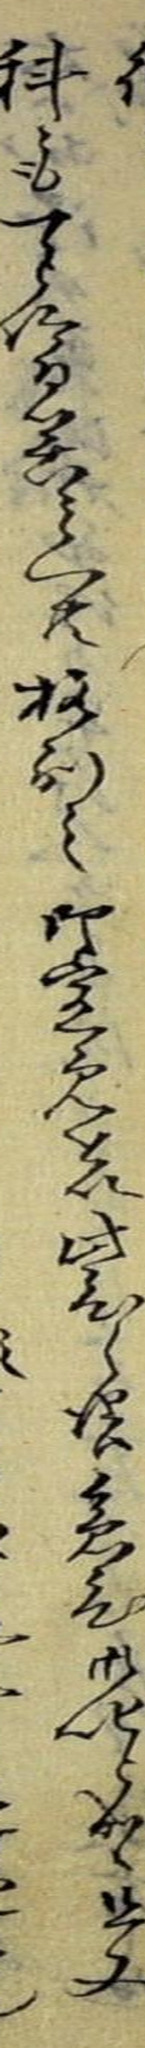科にも可被仰付筈に候へ共格別之御宥免を以此度之儀は急度御叱被成候且又
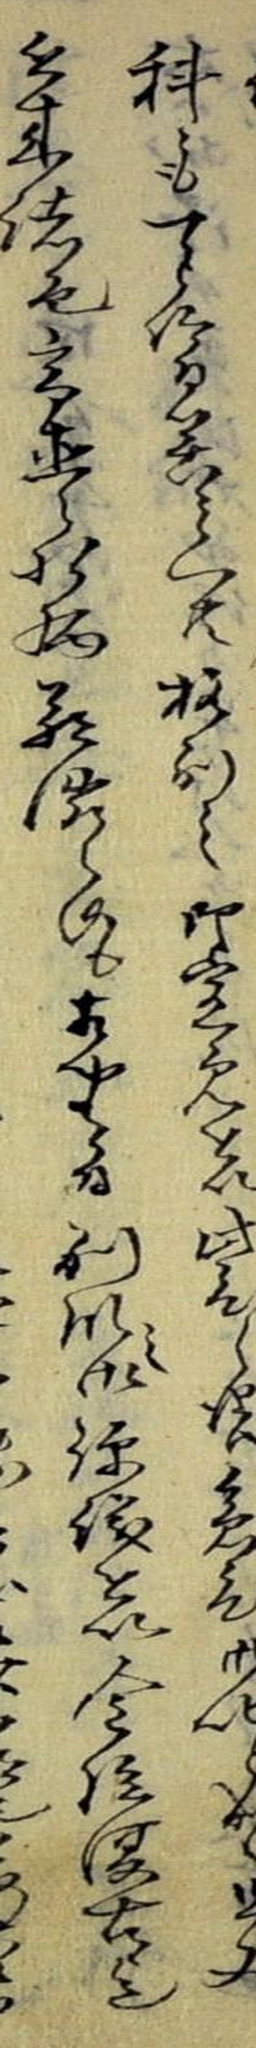近来諸色高直之折柄難渋之趣も相聞候に付別段之御評議を以金位復古迄
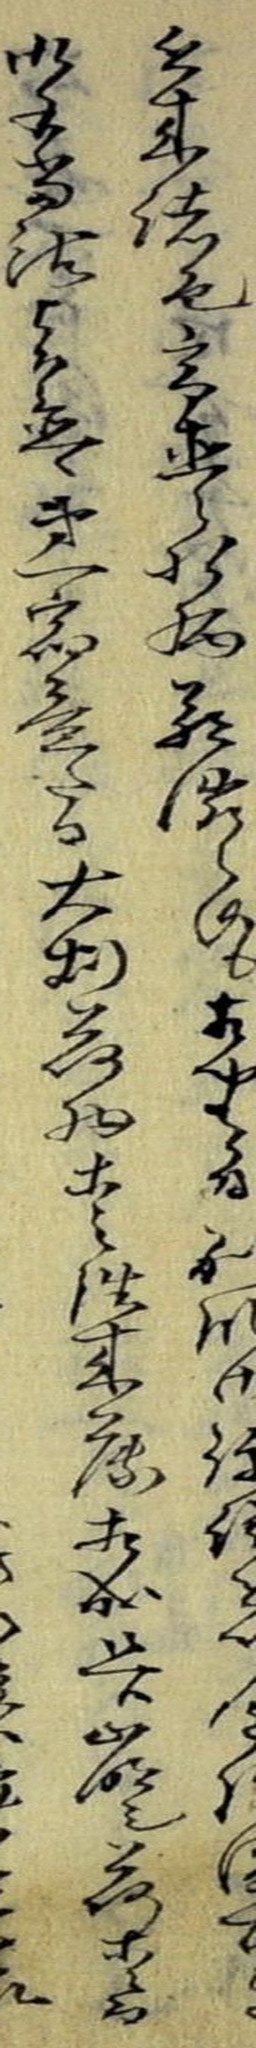御手当銀被下置候第一宿益たる大判荷物等之往来薄相成且は崩し荷等に而
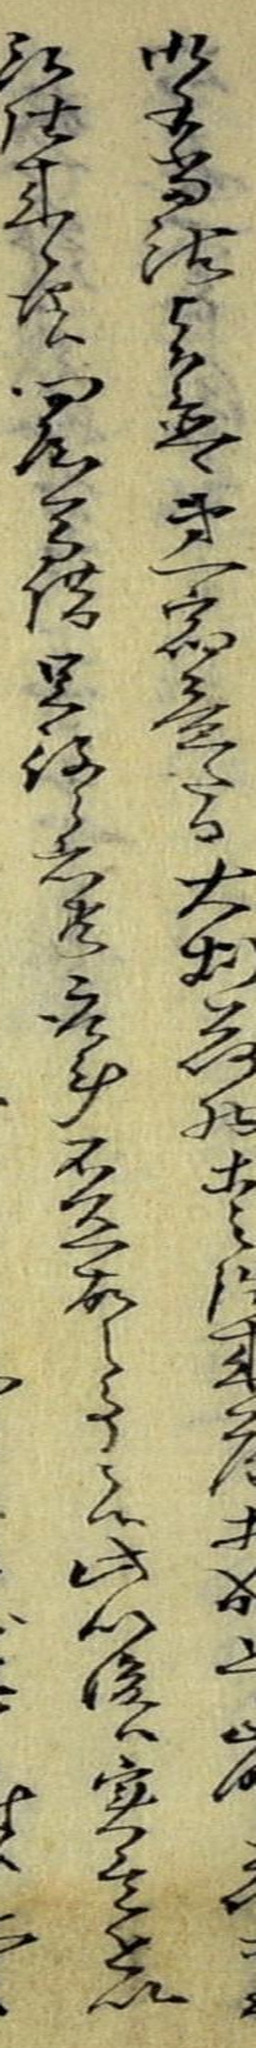致往来候儀は問屋馬借足役之者共取斗不宜故之事に候此以後は実意を以
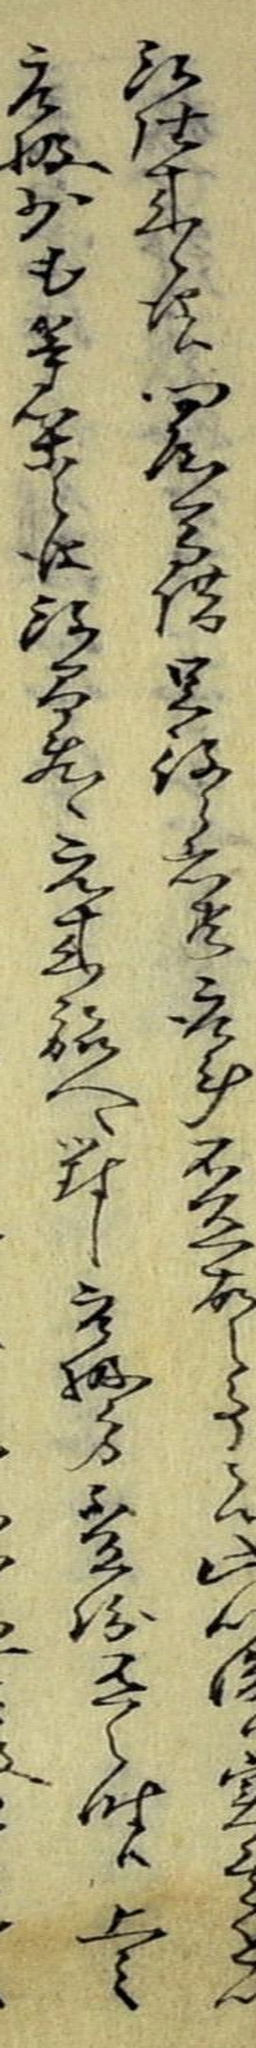取扱少も等閑之儀致間敷候元来旅人へ対し取扱方不宜儀有之時は上之
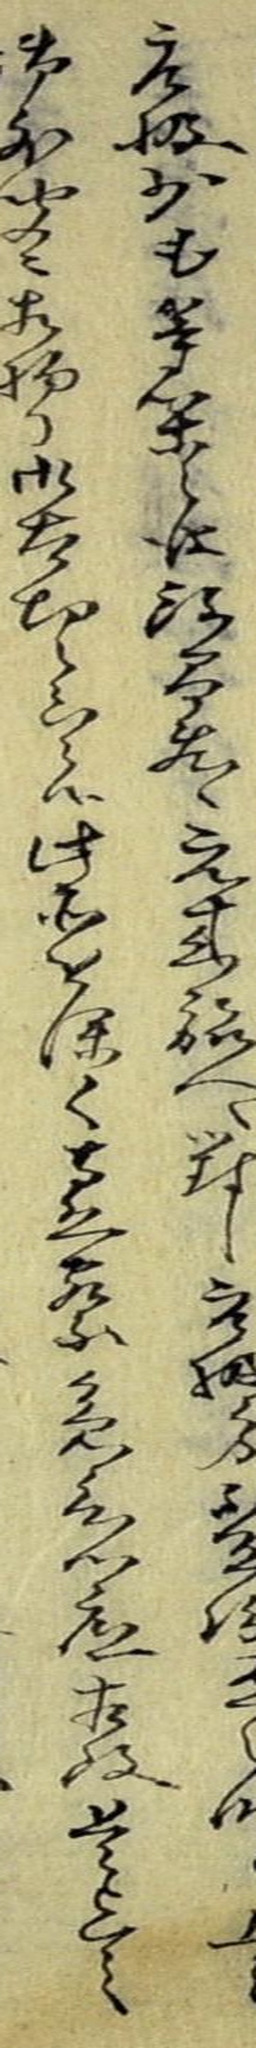御外聞に相拘り御太切之至に候此所を深く守宜察急度心底相改是迄之
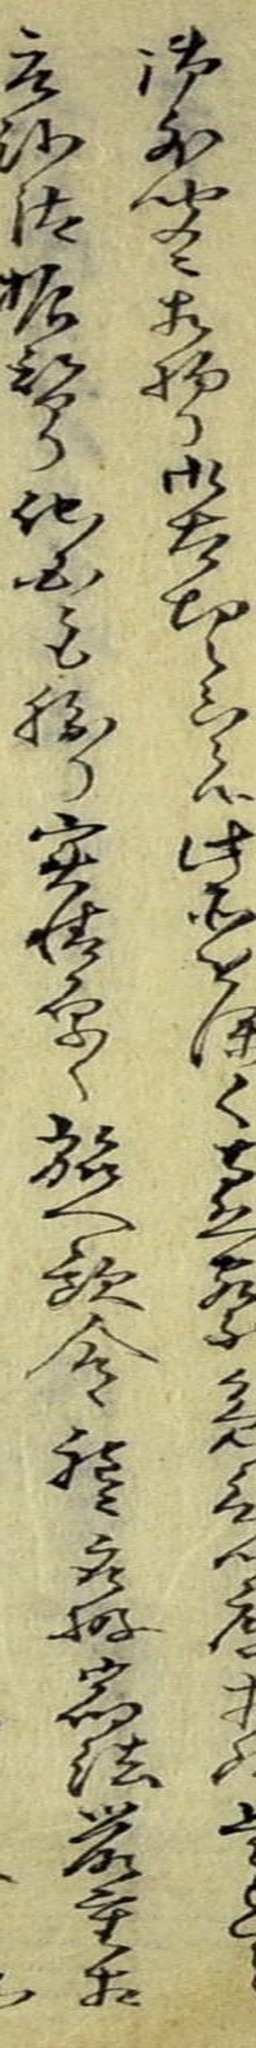取沙汰振替り他国にも勝り実情厚く旅人歓合候程に取扱宿法厳重相
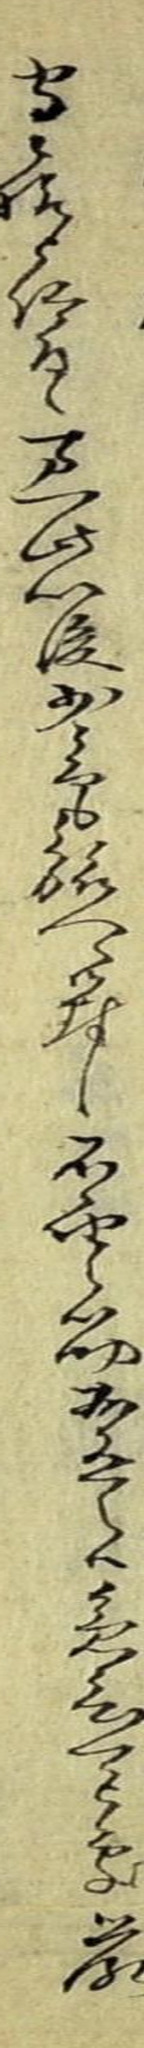守候様被仰付候万一此以後少に而も旅人へ対し不届之筋於有之は急度可被処厳
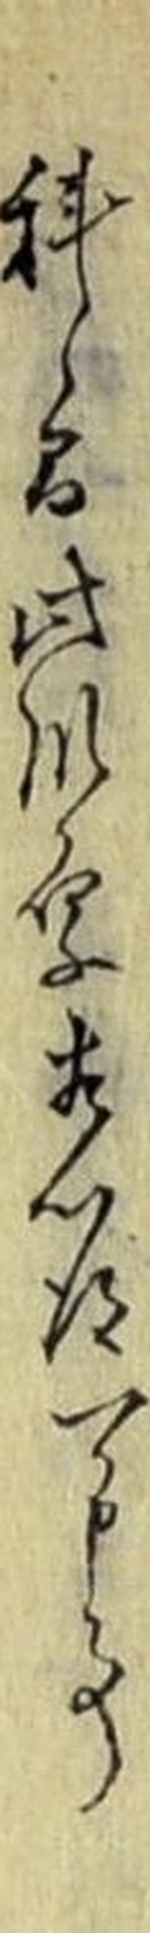科に候間此段厚相心得可申事
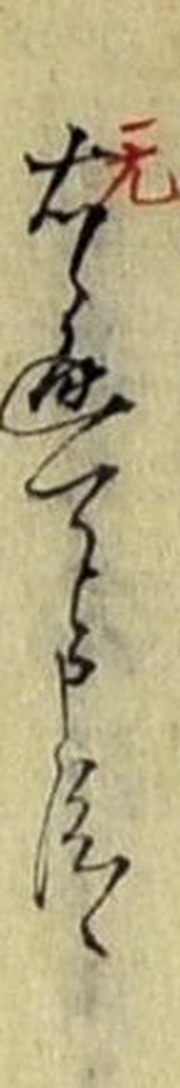右之通可被申渡候
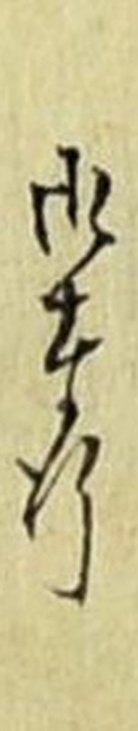御奉行
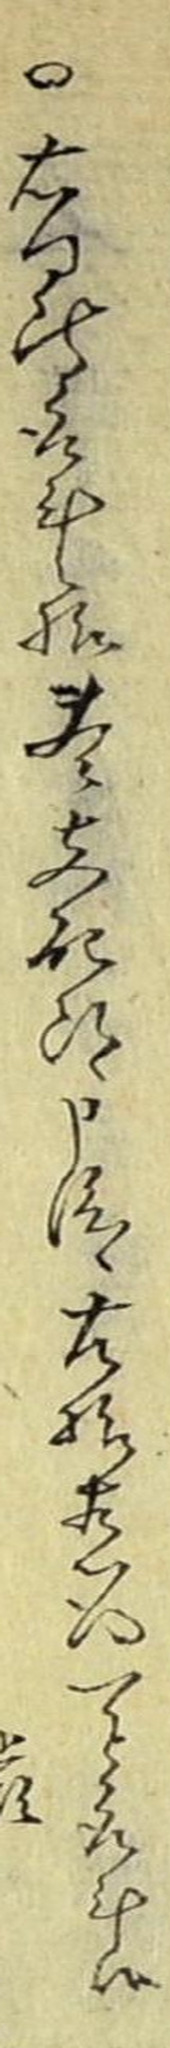○右同断取斗候様夫々支配頭へ申渡候左様相心得可被取斗候
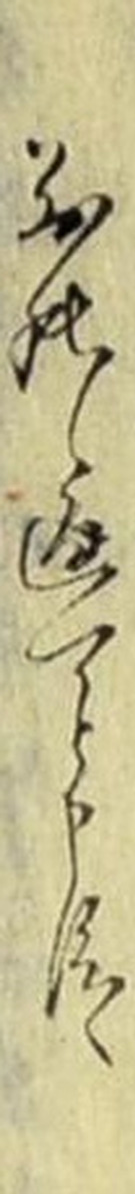右之通可被申渡候
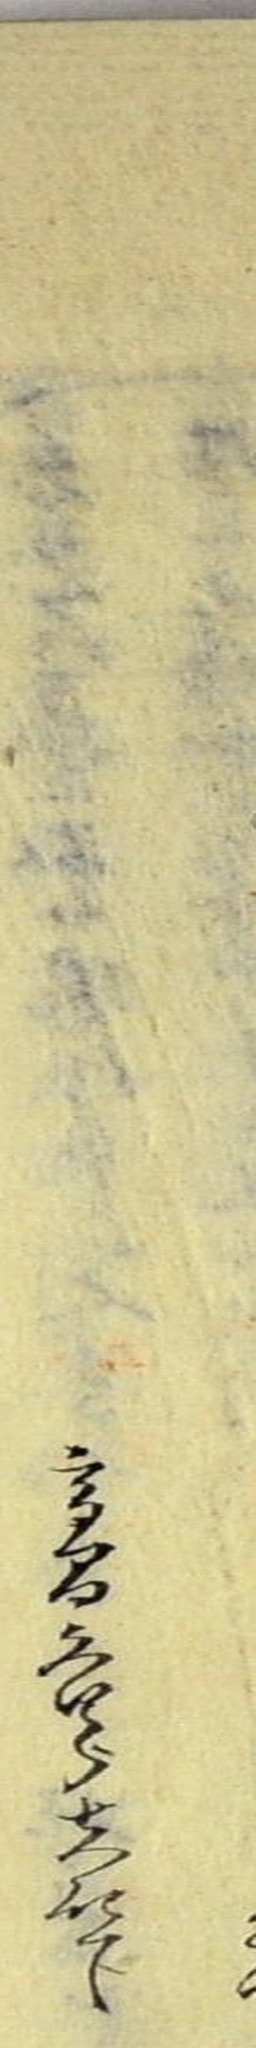高間文四郎支配下
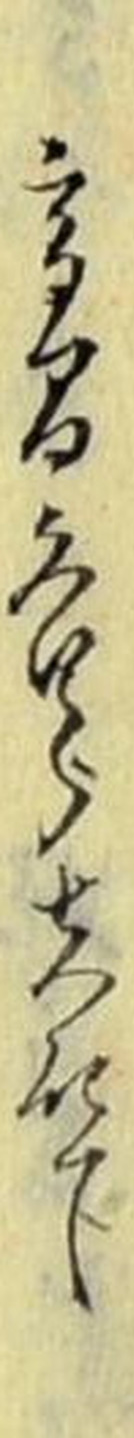高間文四郎支配下
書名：命令之部 六
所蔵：福井県文書館 Fukui Prefectural Archives
